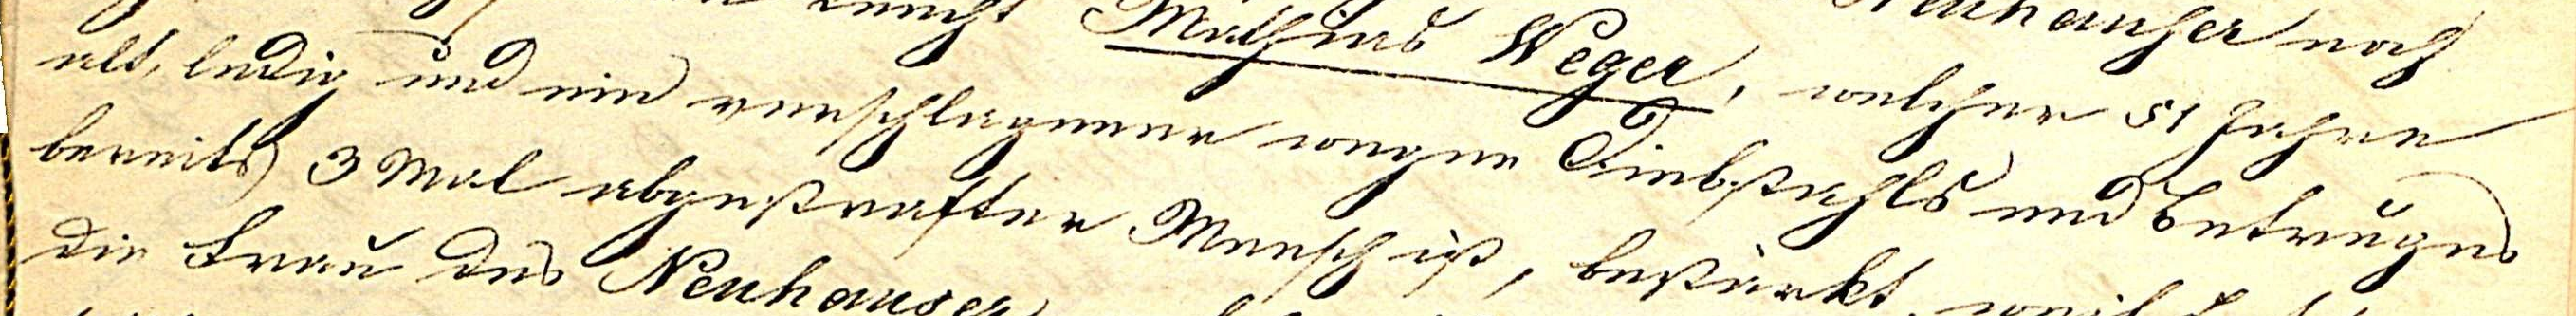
alt, ledig und ein verschlagener wegen Diebstahls und Betruges
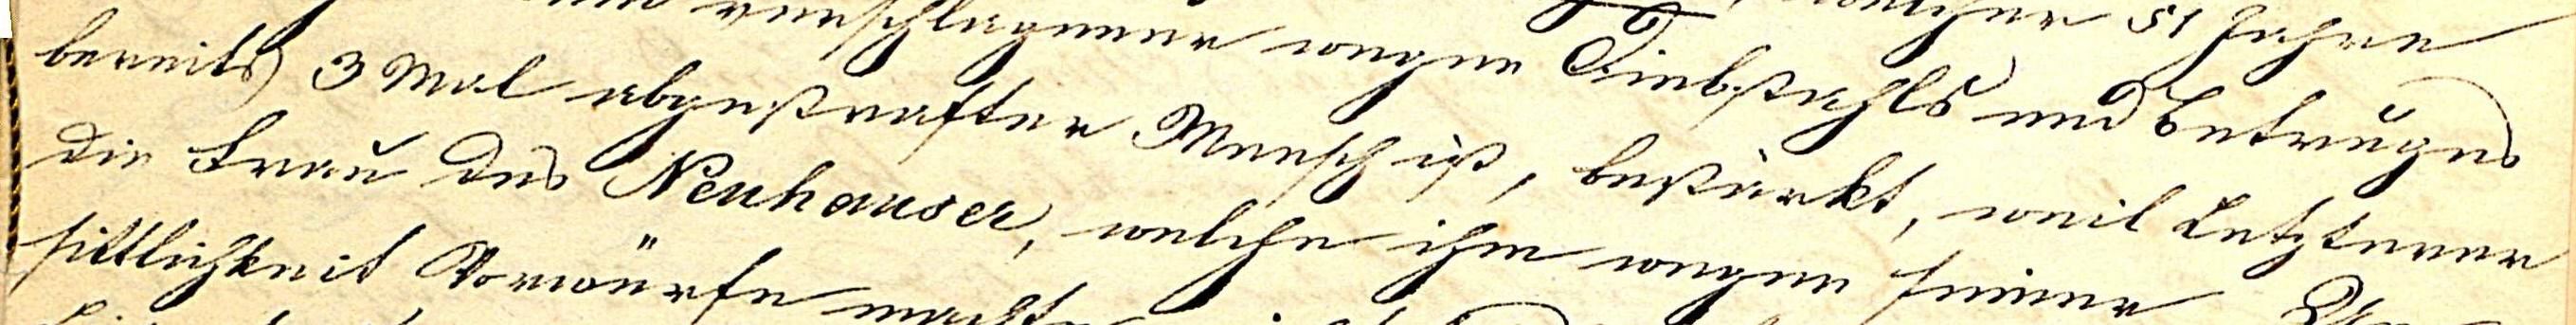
bereits 3Mal abgestrafter Mensch ist, bestärkt, weil Letzterer
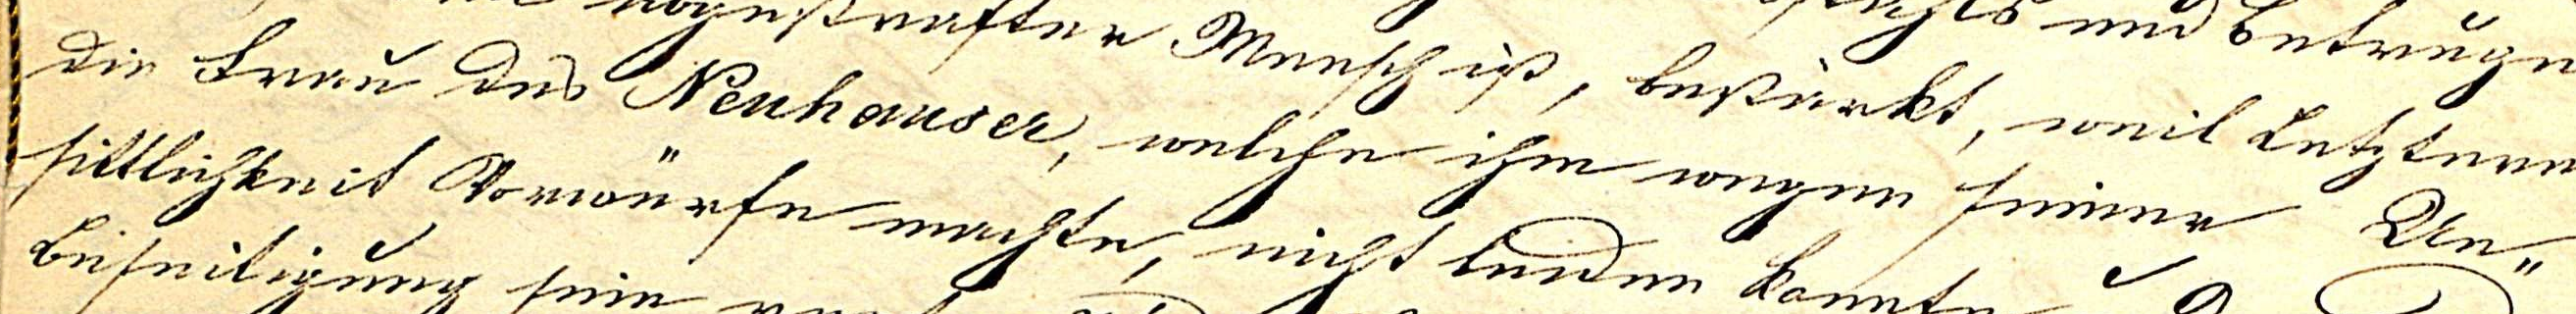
die Frau des Neuhauser, welche ihm wegen seiner Un¬
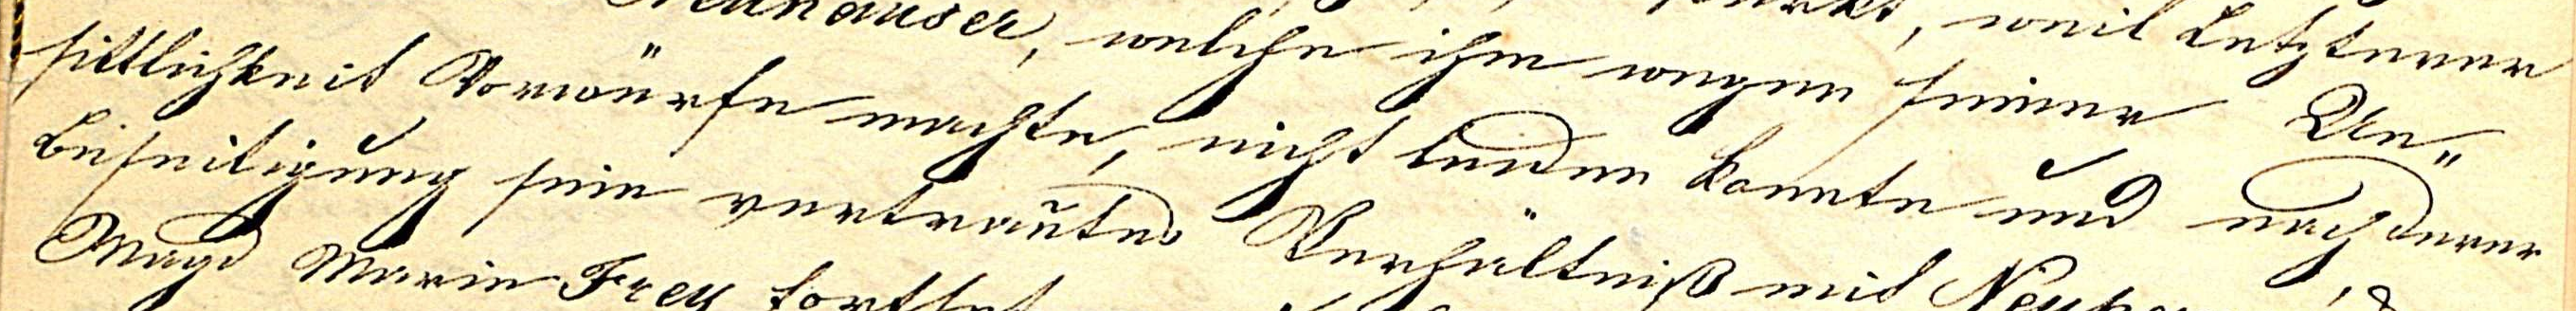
sittlichkeit Vorwürfe machte, nicht leiden konnte und nach derer
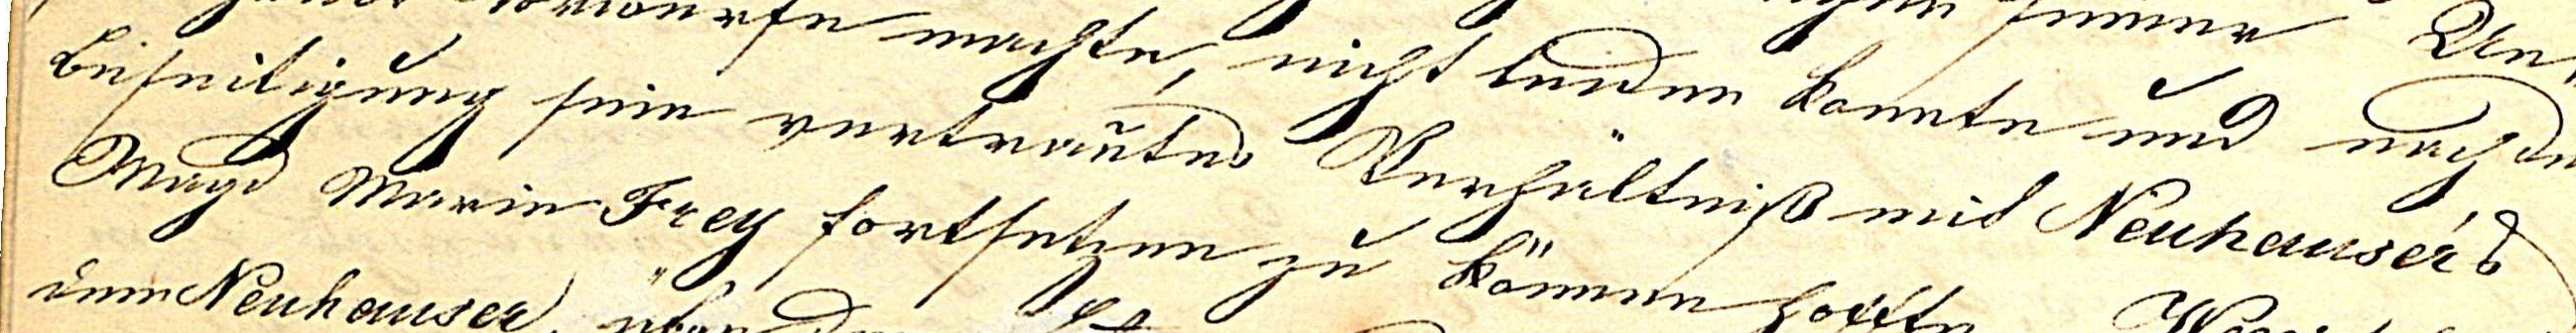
Beseitigung sein vertrauter Verhältniß mit Neuhauser’s
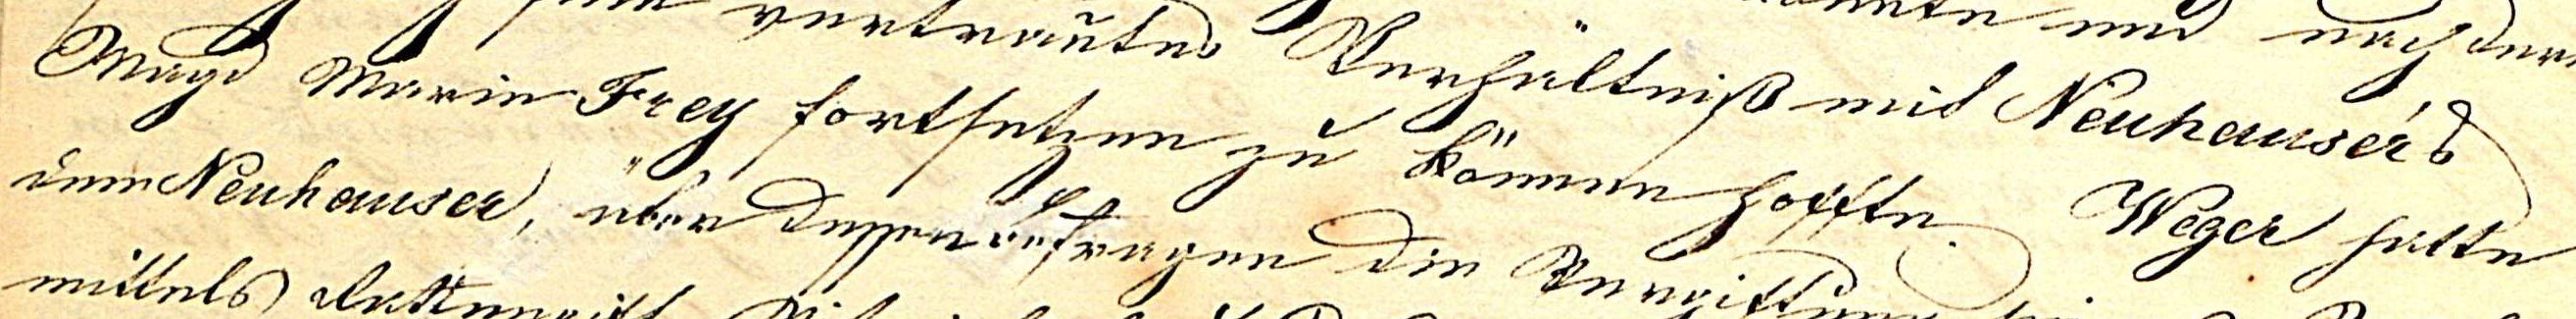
Magd Marie Frey fortsetzten zu können hoffte. Weger hatte
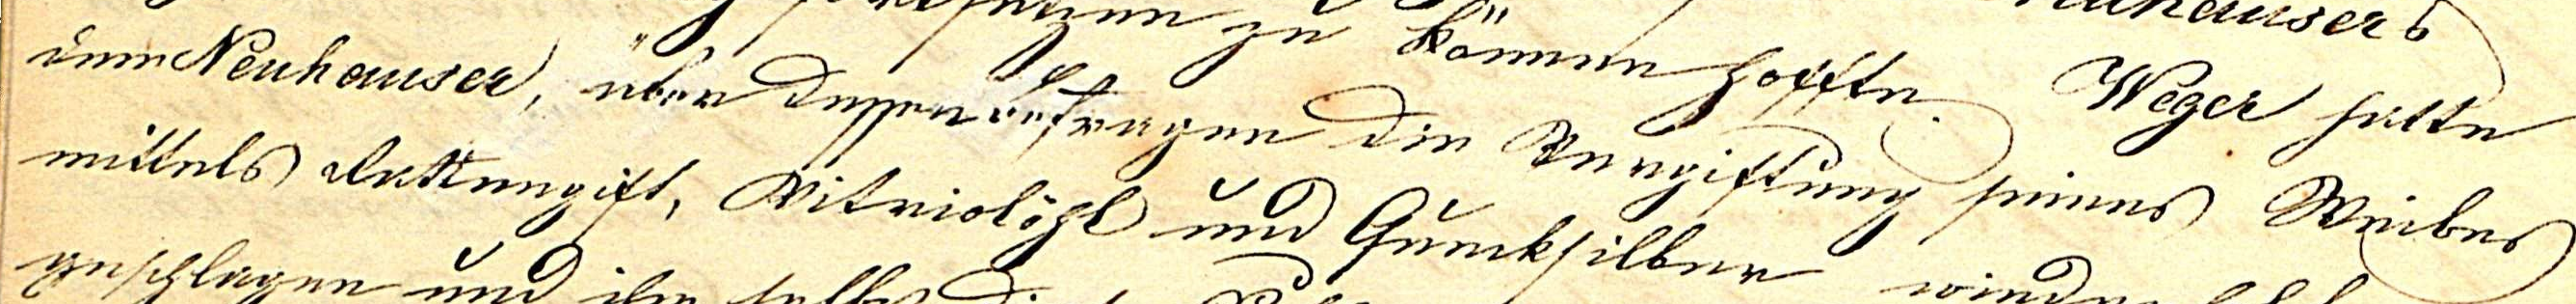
dem Neuhauser, über dessen Befragen die Vergiftung seines Weibes
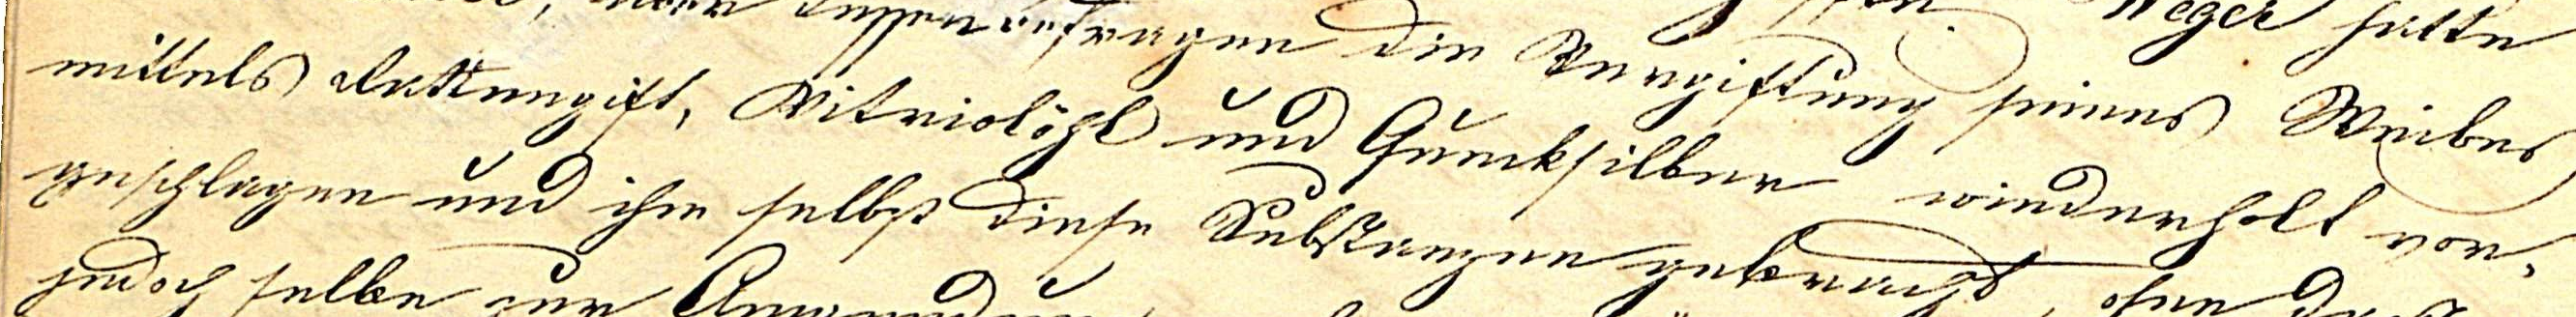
mittels Rattengift, Vitriolöhl und Quecksilber wiederholt vor¬
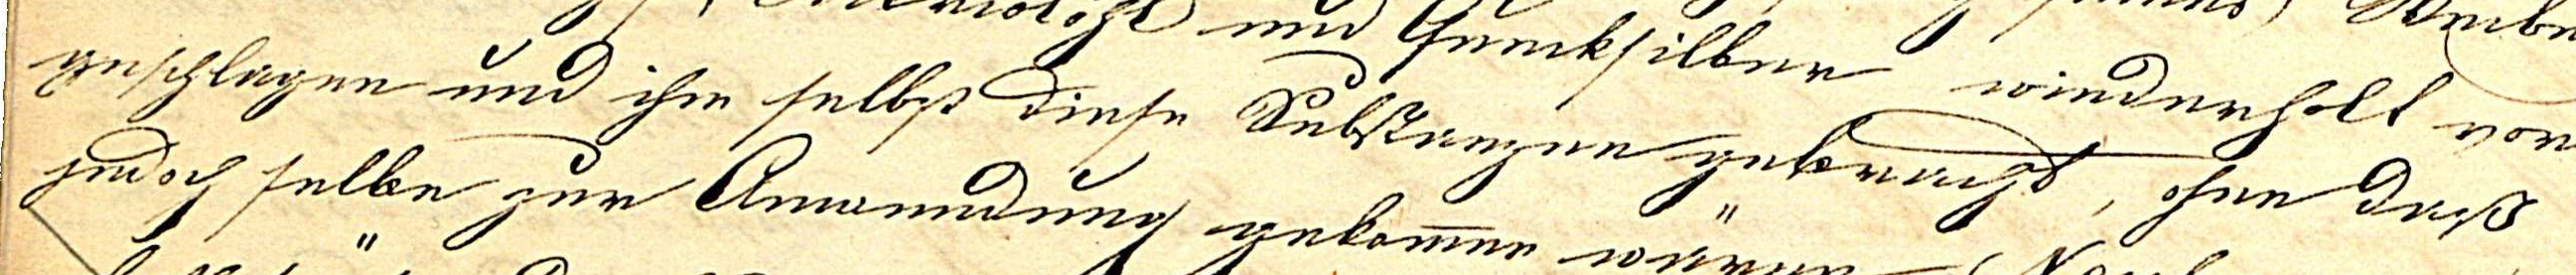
geschlagen und ihm selbst diese Substanzen gebracht, ohne daß
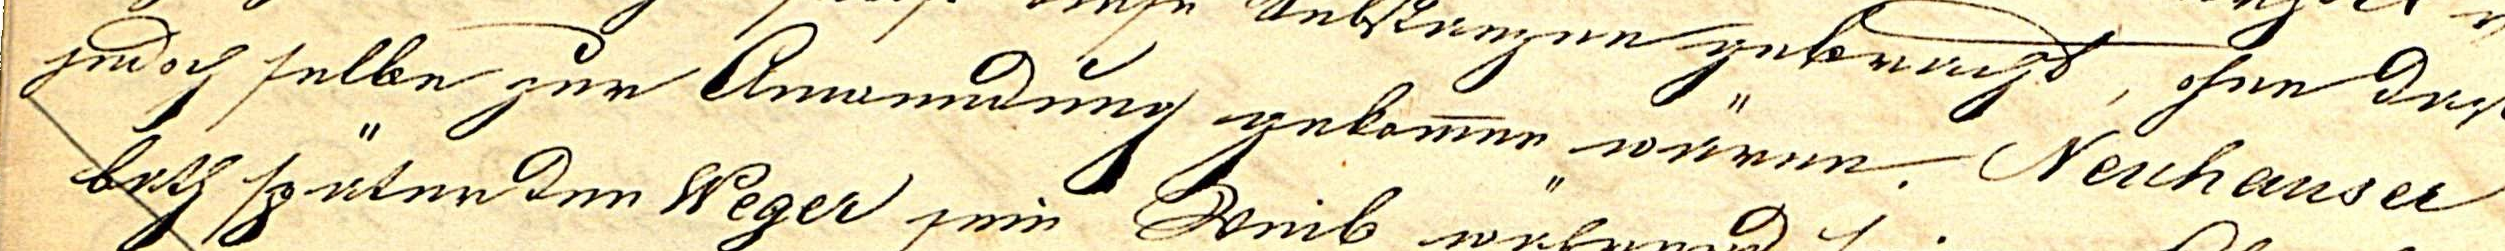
jedoch selbe zur Anwendung gekommen wären. Neuhauser
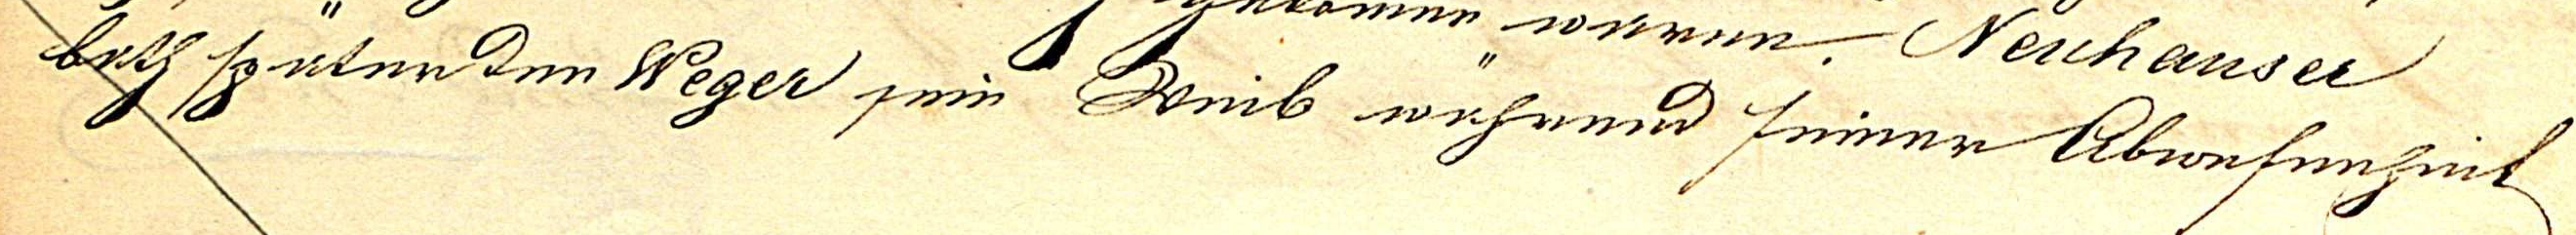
bath später dem Weger sein Weib während seiner Abwesenheit
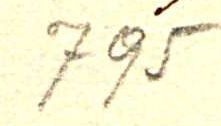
795
